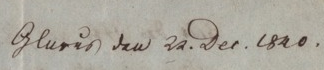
Glarus den 22. Dec. 1840.
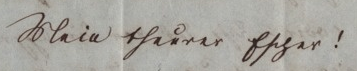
Mein theurer Escher!
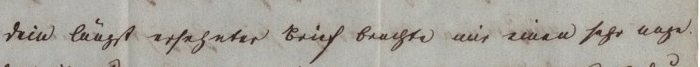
Dein längst ersehnter Brief brachte mir einen sehr ange-
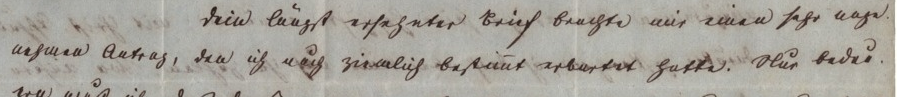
nehmen Antrag, den ich auch ziemlich bestimmt erwartet hatte. Nur bedau-
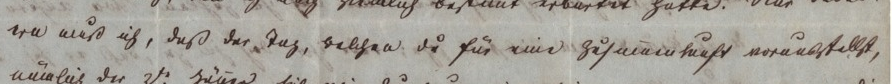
ern muß ich, daß der Tag, welchen du für eine Zusammenkunft vorausstellst,
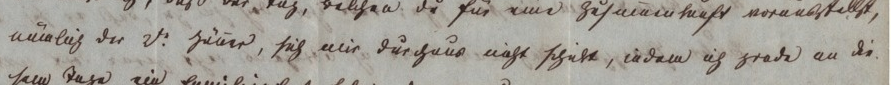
nämlich der 2te Jänner, sich mir durchaus nicht schickt, indem ich grade an die-
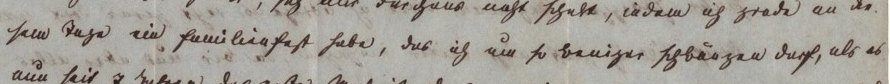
sem Tage ein Familienfest habe, das ich um so weniger schwänzen darf, als es
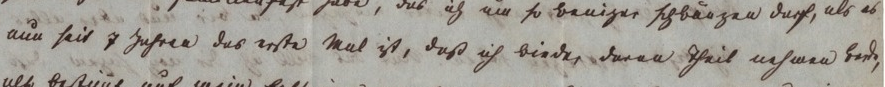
nun seit 7 Jahren das erste Mal ist, daß ich wieder daran Theil nehmen werde,
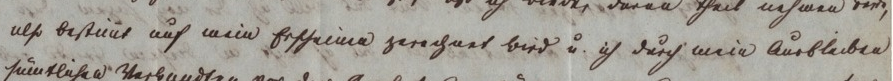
also bestimmt auf mein Erscheinen gerechnet wird u. ich durch mein Ausbleiben
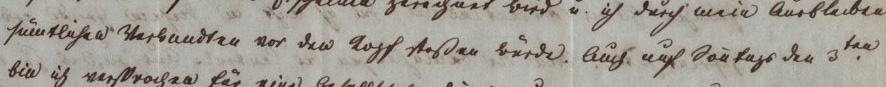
sämtlichen Verwandten vor den Kopf stoßen würde. Auch auf Sonntags den 3ten
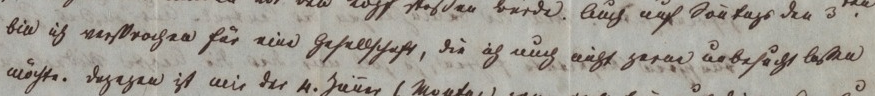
bin ich versprochen für eine Gesellschaft, die ich auch nicht gerne unbesucht lassen
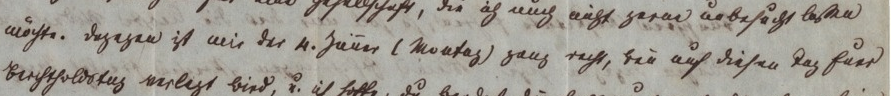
möchte. Dagegen ist mir der 4. Jänner (Montag) ganz recht, wenn auf diesen Tag Euer
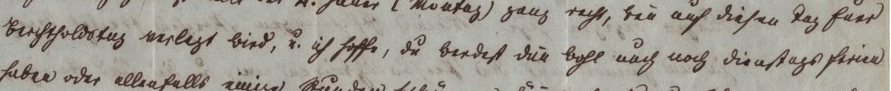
Berchtholdstag verlegt wird, u. ich hoffe, du werdest dann wohl auch noch Dienstags Ferien
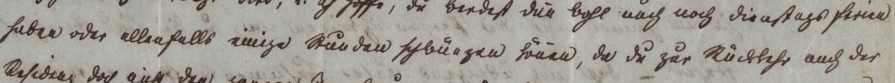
haben oder allenfalls einige Stunden schwänzen können, da du zur Rückkehr nach der
